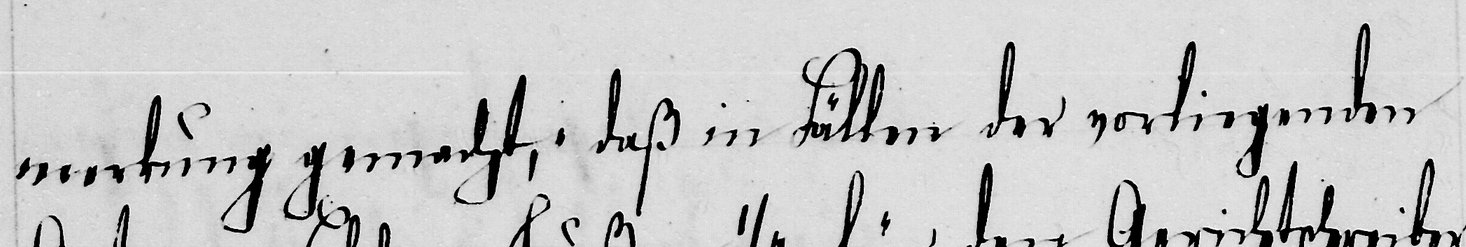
merkung macht, „daß in Fällen der vorliegenden
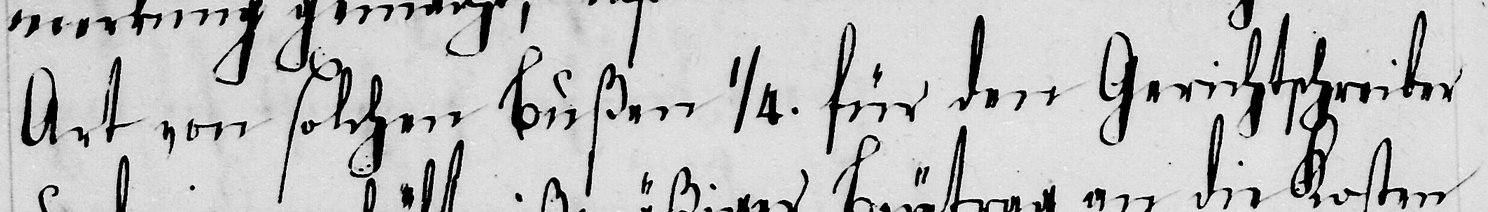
Art von solchen Bußen ¼. für den Gerichtsschreiber
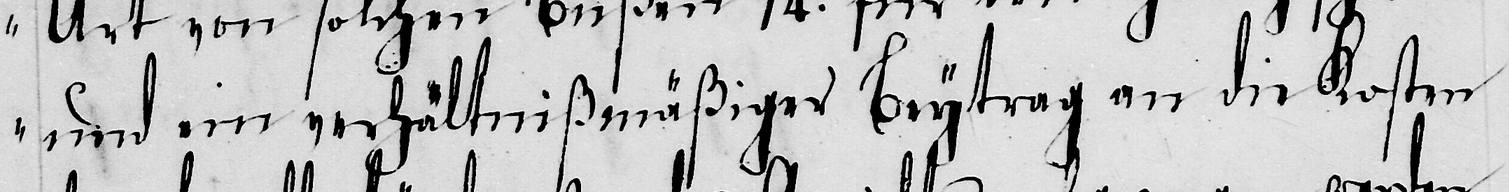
und ein verhältnißmäßiger Beytrag an die Kosten
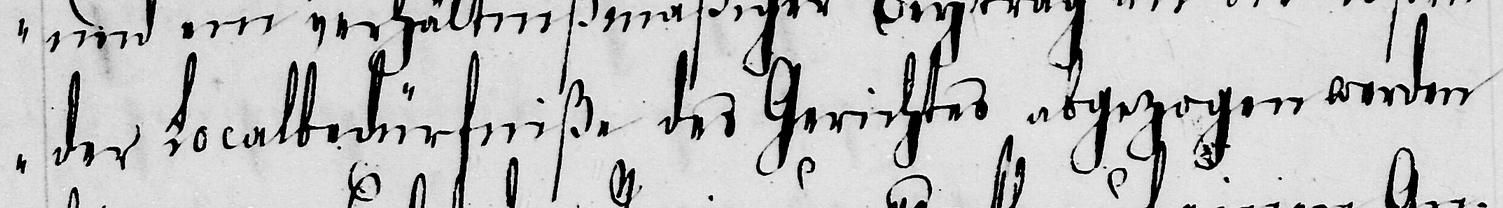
der Localbedürfniße des Gerichtes abgezogen werden
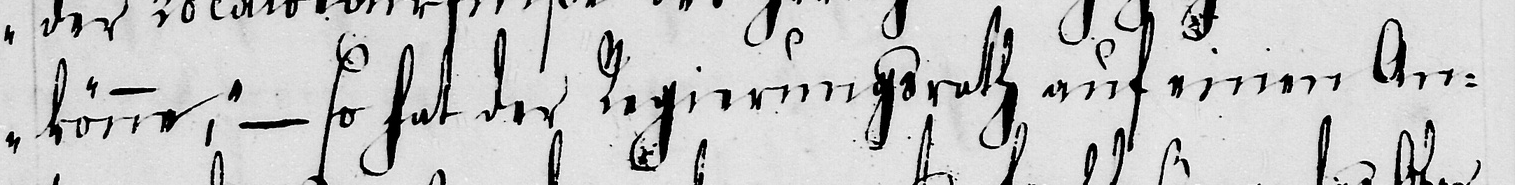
könne,“ – so hat der Regierungsrath auf einen An¬
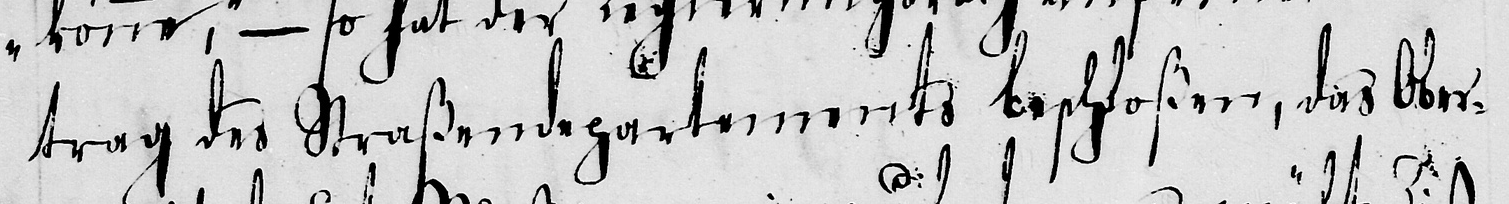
trag des Straßendepartements beschloßen, das Ober¬
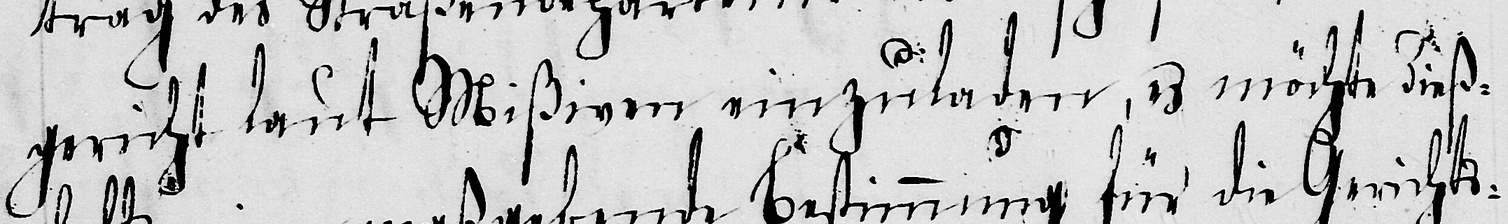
gericht laut Mißiven einzuladen, es möchte dieß¬
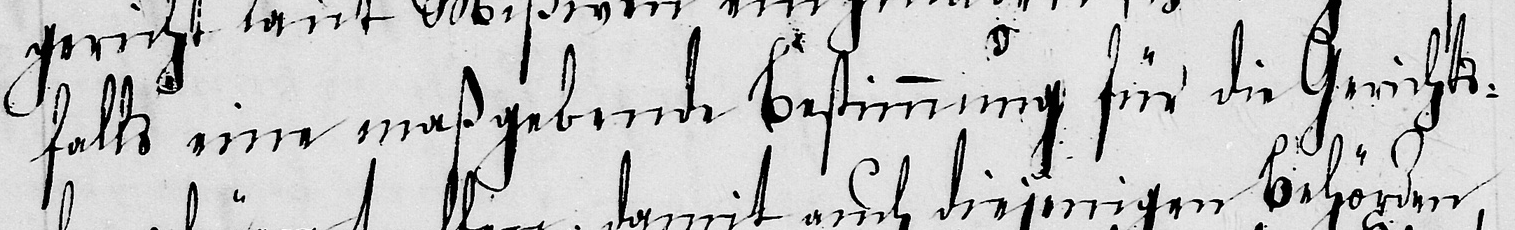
falls eine maßgebende Bestimmung für die Gerichts¬
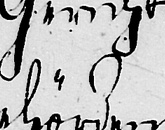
en
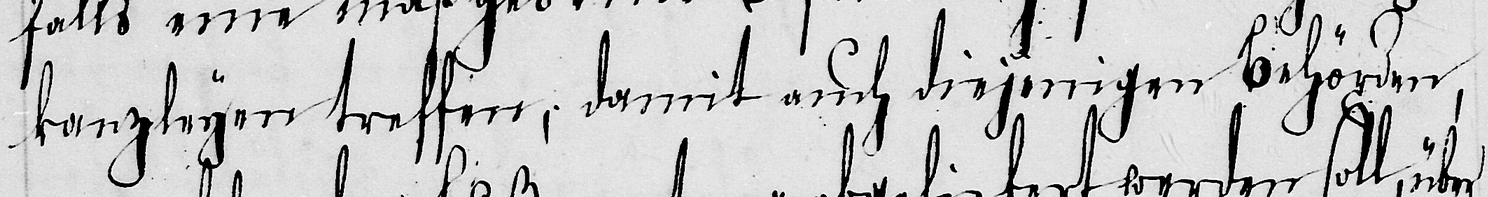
kanzleyen treffen, damit auch diejenigen Behörden,
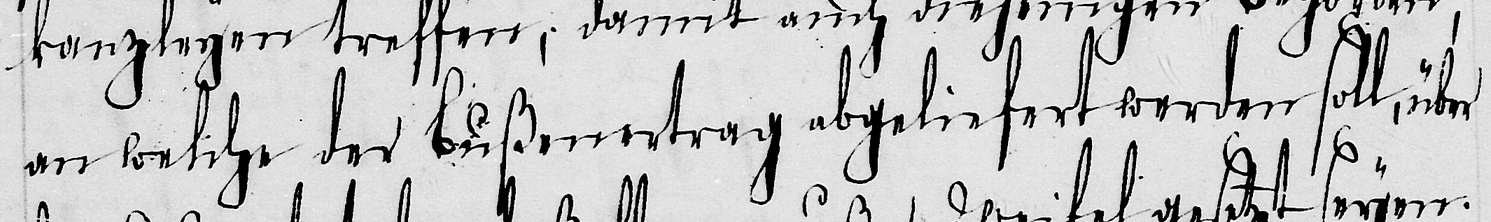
an welche der Bußenertrag abgeliefert werden soll, ü¬
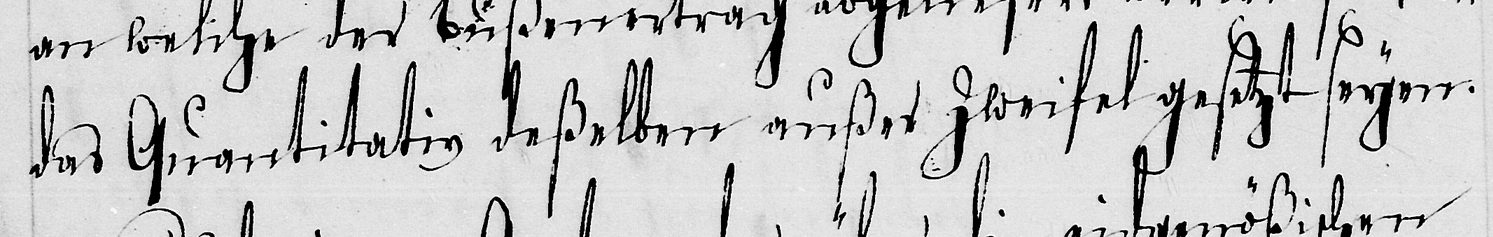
das Quantitativ deßelben außer Zweifel gesetzt seyen.
